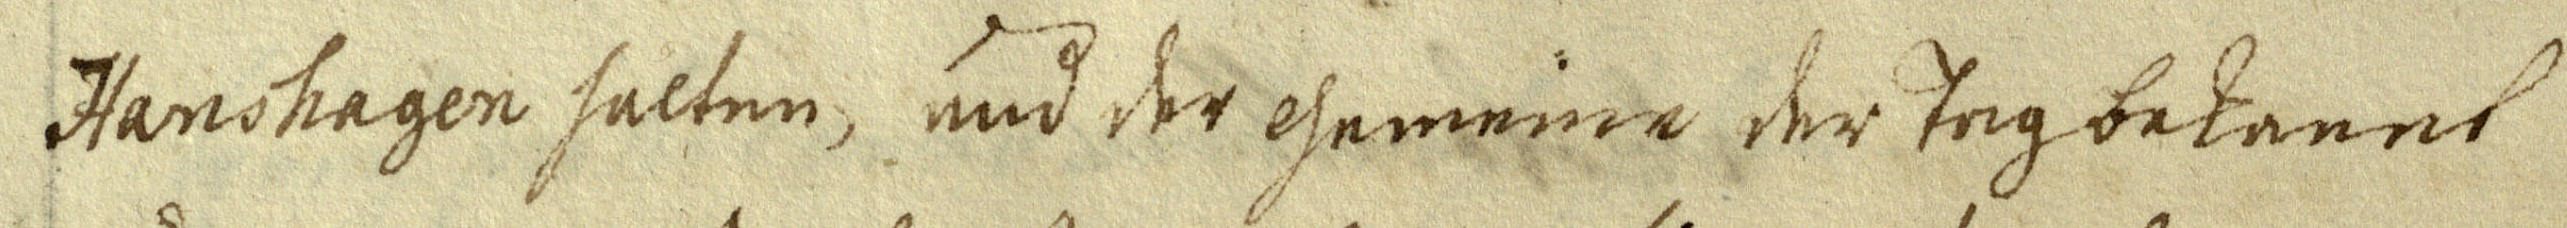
Hanshagen halten, und der Gemeine der Tag bekannt
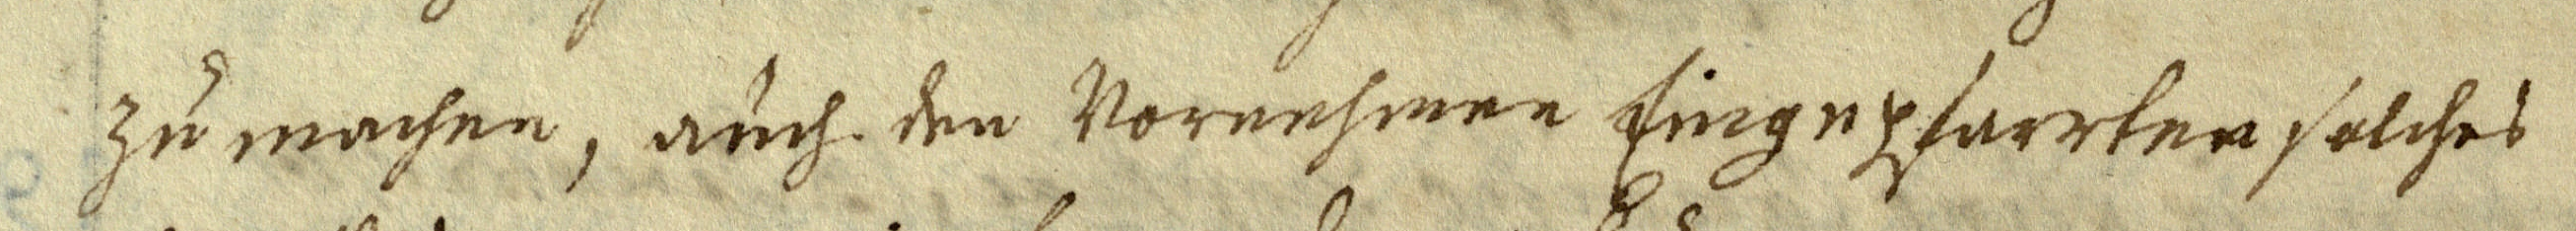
zu machen, auch den Vornehmen Eingepfarrten solches
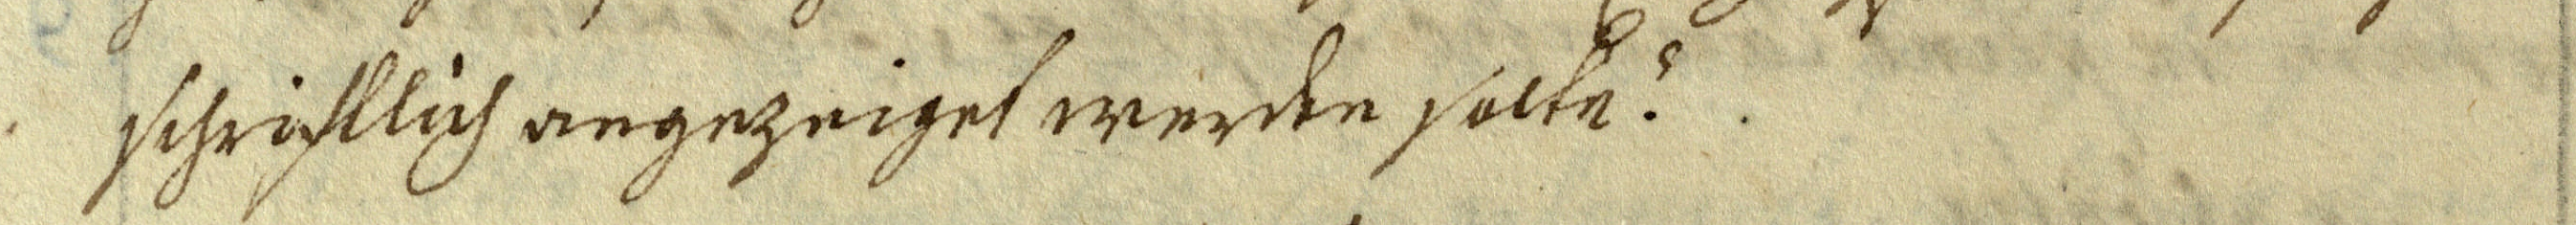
schriftlich angezeiget werden solte!
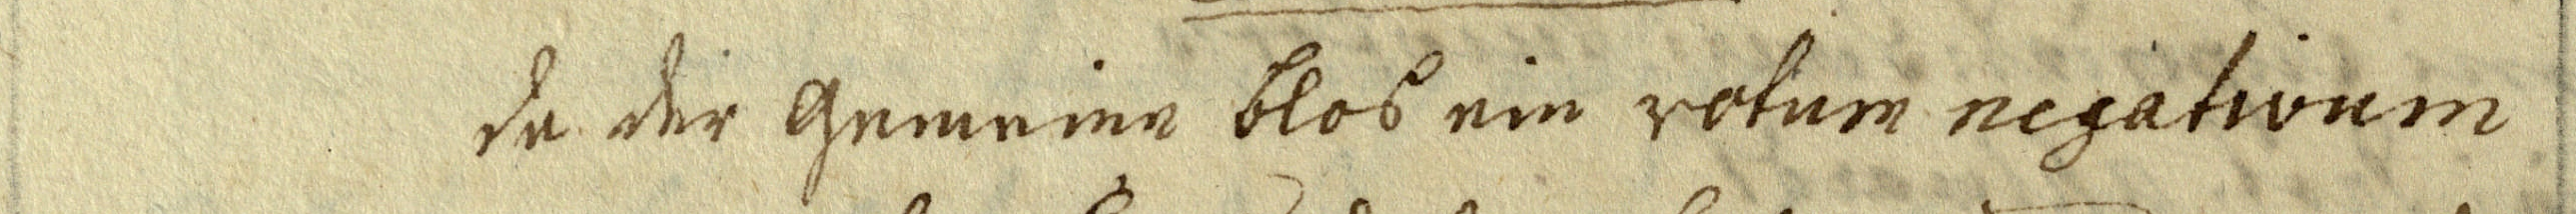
da der Gemeine blos ein votum negativum
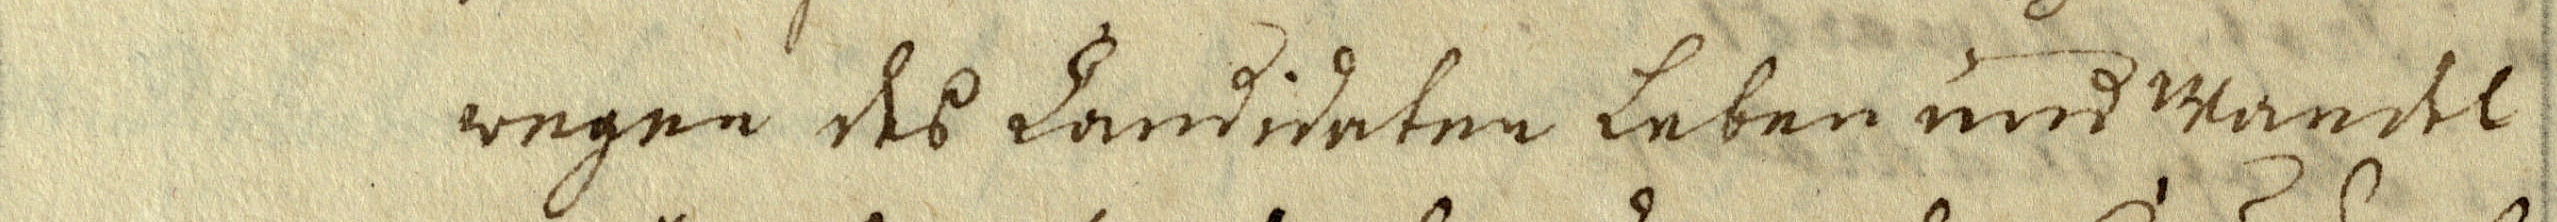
wegen des Candidaten Leben und Wandel
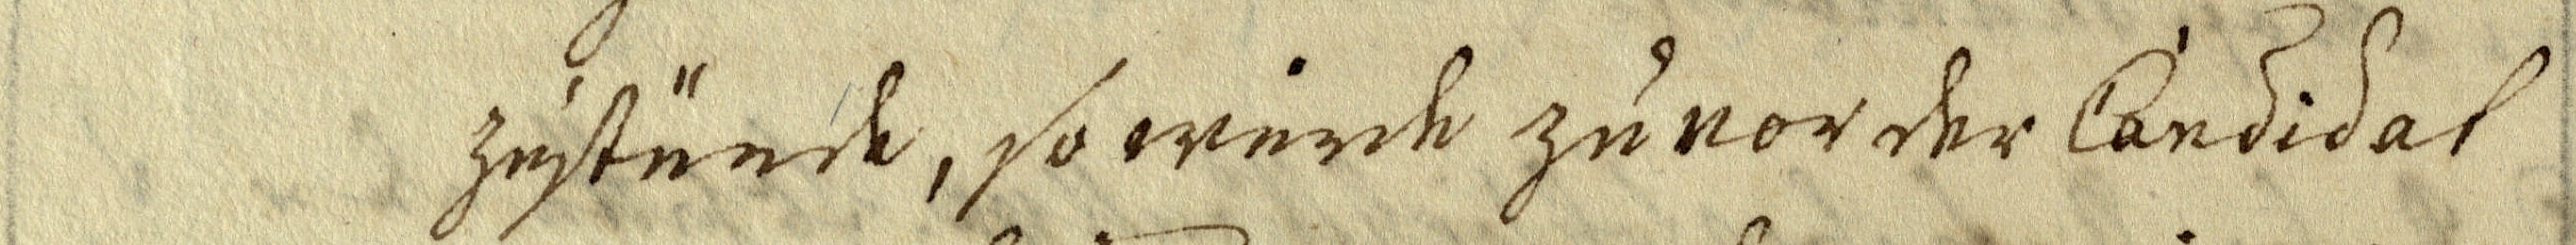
zustünde, so würde zu vor der Candidat
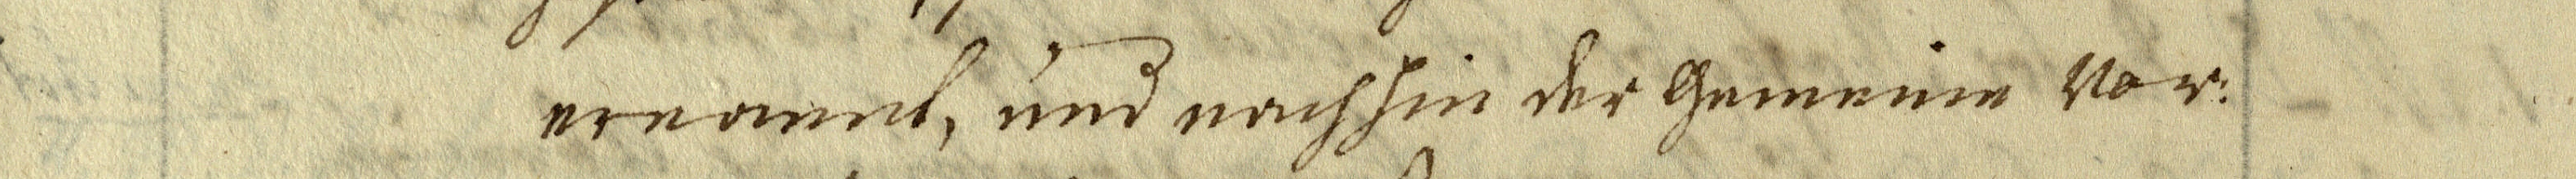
ernannt, und nach hin der Gemeine vor¬
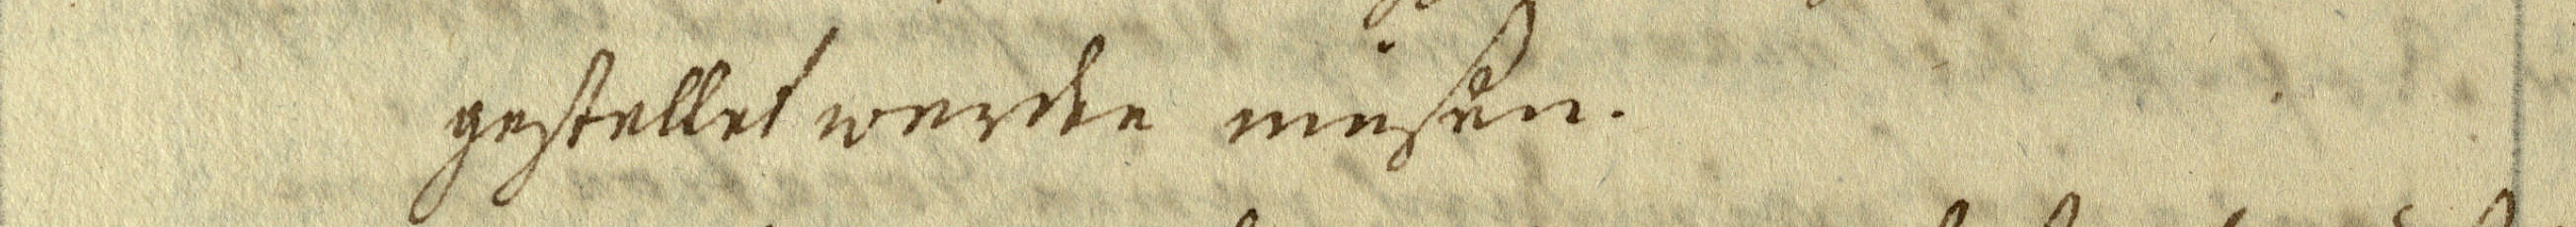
gestellet werden müßen.
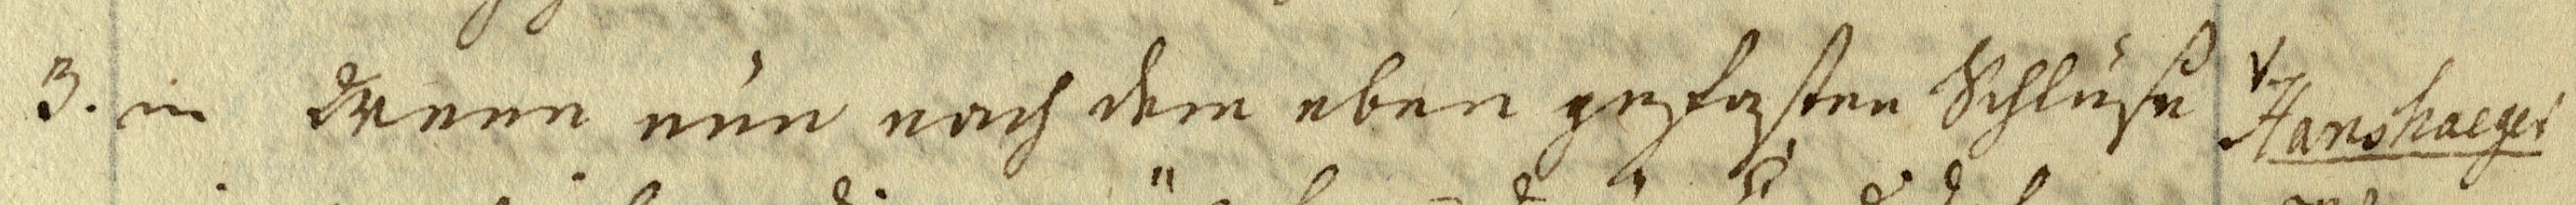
3. Wenn nun nach dem eben gefasten Schluße Hanshaeger
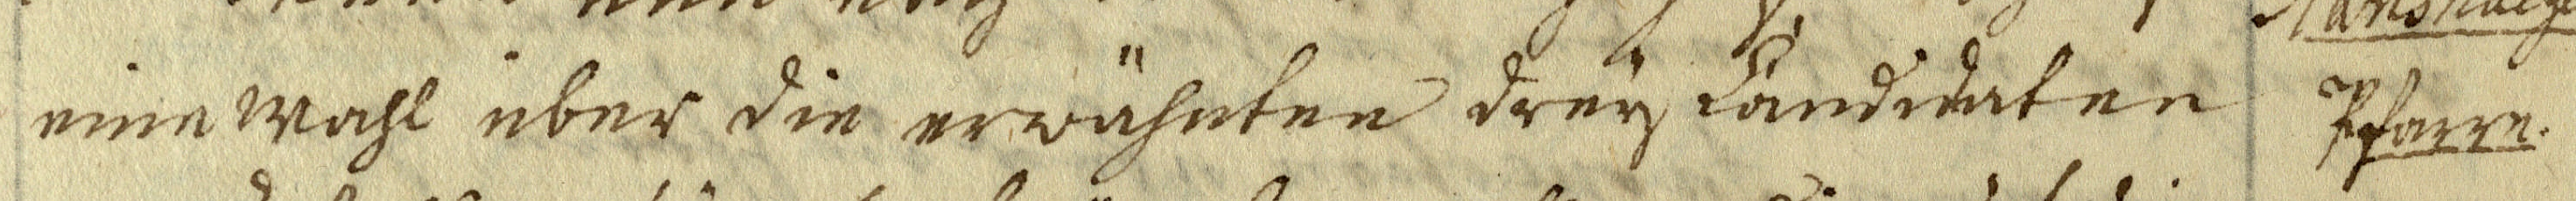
eine Wahl über die erwähnten dreÿ Candidaten Pfarre
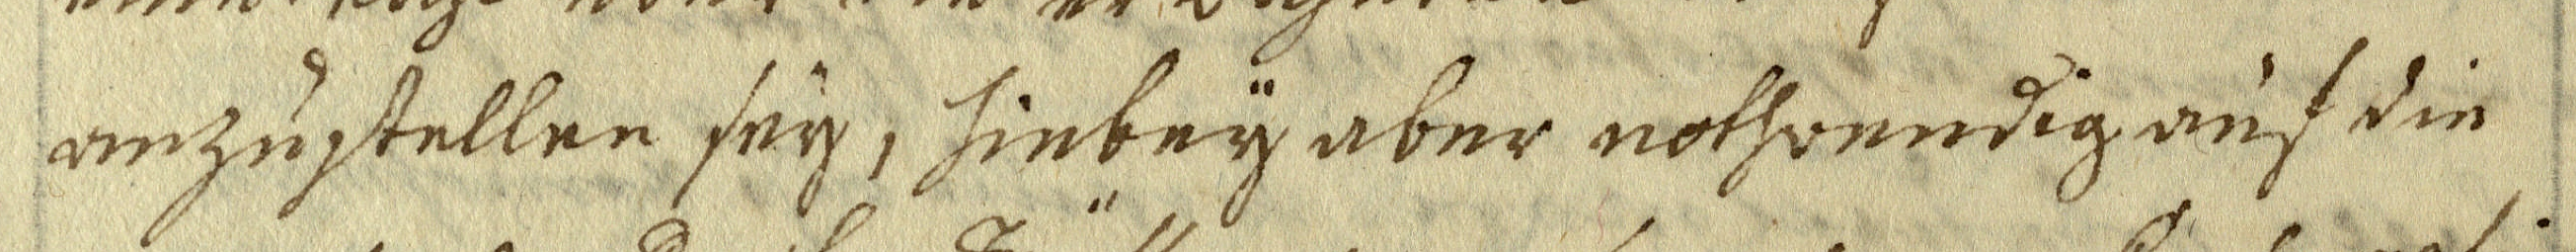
anzustellen seÿ, hiebeÿ aber nothwendig auf die
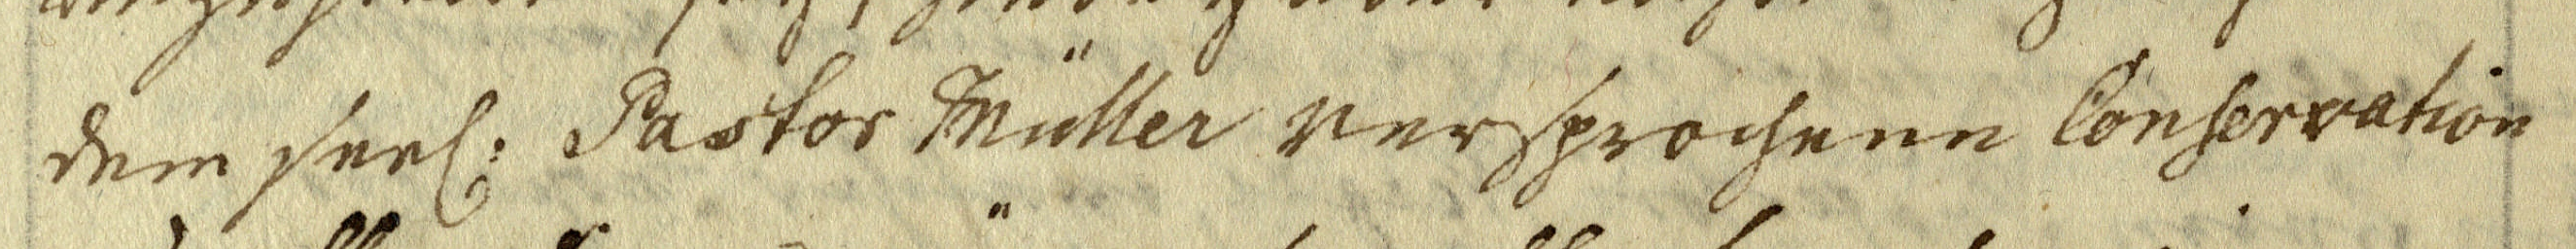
dem seel: Pastor Müller versprochene Conservation
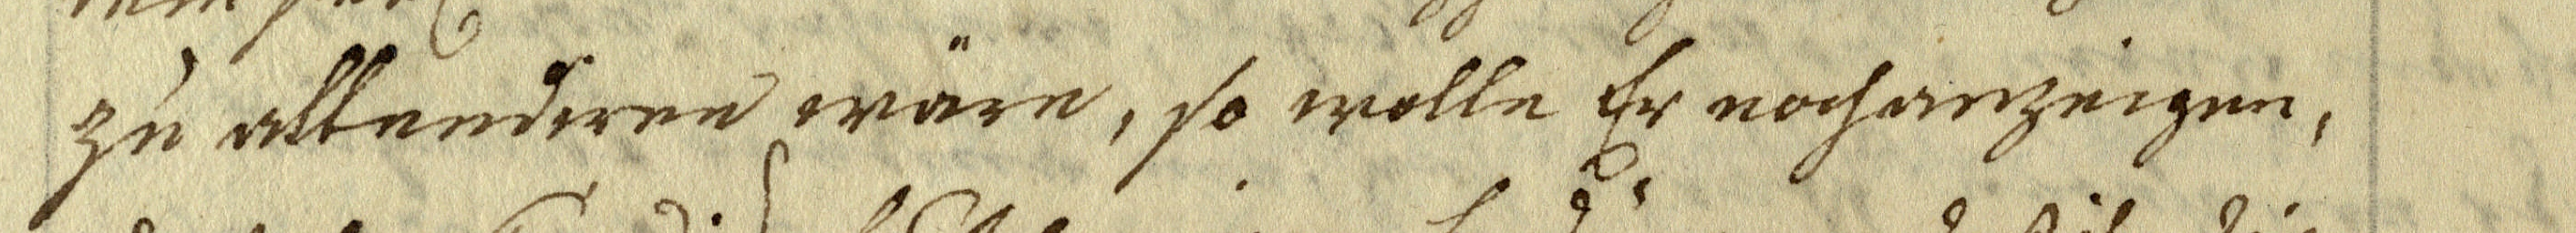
zu altendiren wäre, so wolle Er nochanzeigen,
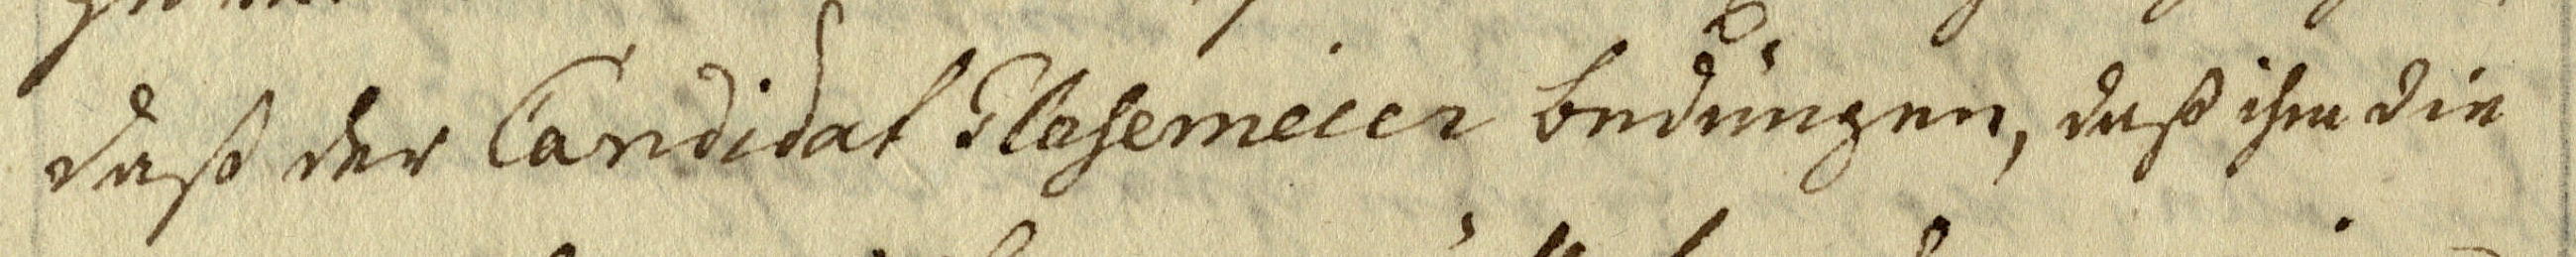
daß der Candidat Glasemeier bedungen, daß ihm die
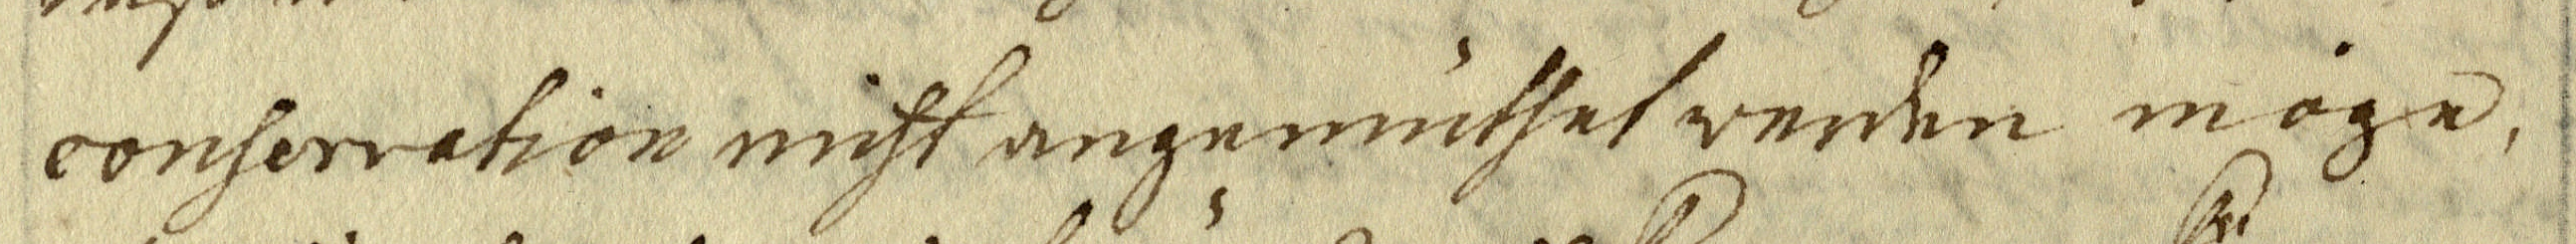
conservation nicht angemuthet werden möge,
